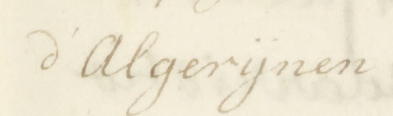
d'Algerijnen
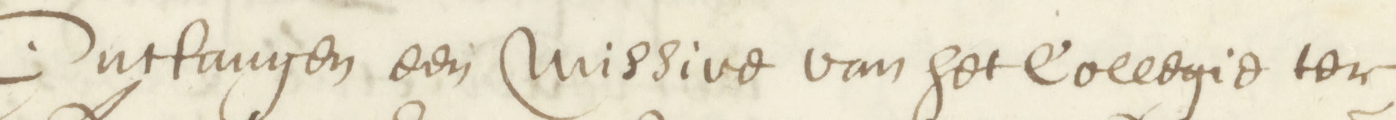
Ontfangen een missive van het Collegie ter
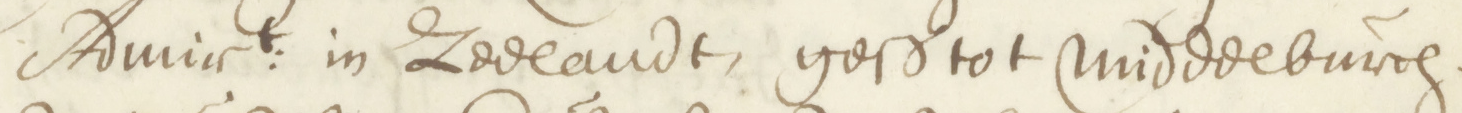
Admirt. in Zeelandt, gess tot middelburch -
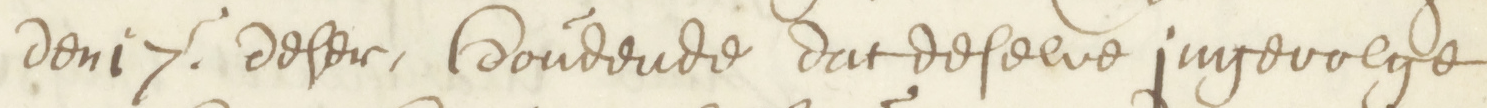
den 17e. deser, houdende dat deselve ingevolge
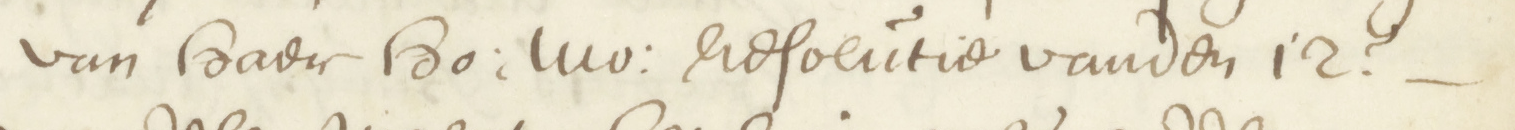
van haer ho:mo: resolutie vanden 12e —
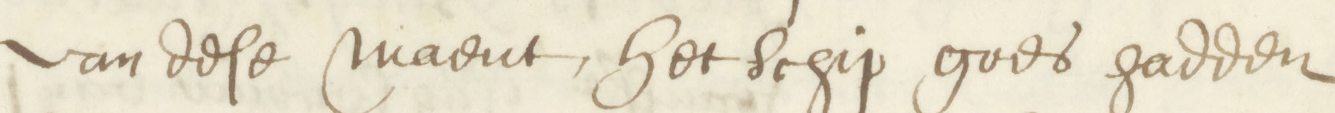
van dese maent, het schip goes hadden
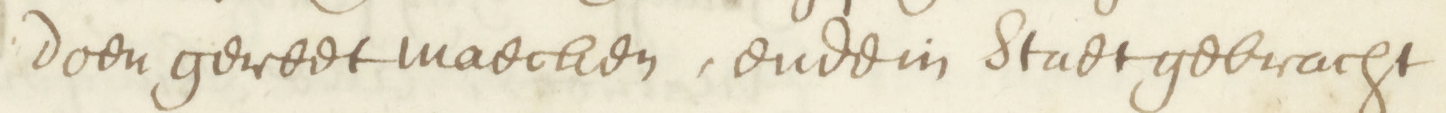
doen gereet maecken, ende in staet gebracht —
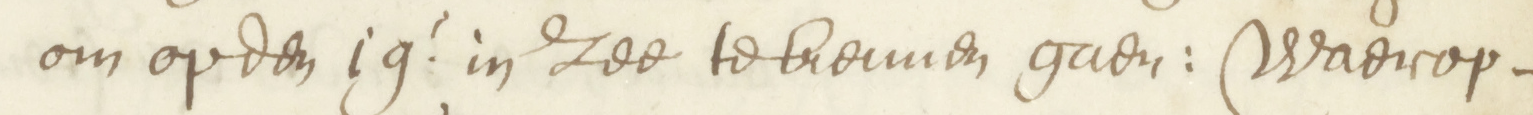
om opden 19e. in Zee te kennen gaen: Waerop -
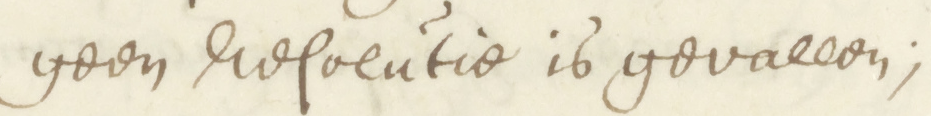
geen resolutie is gevallen;
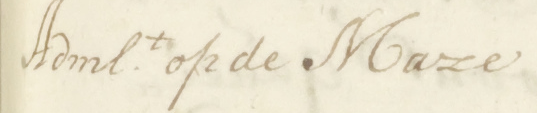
Admlt. op de Maze
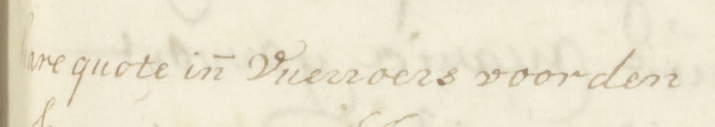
hare quote in Vuerroers voor den
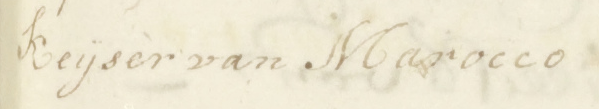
keijser van Marocco
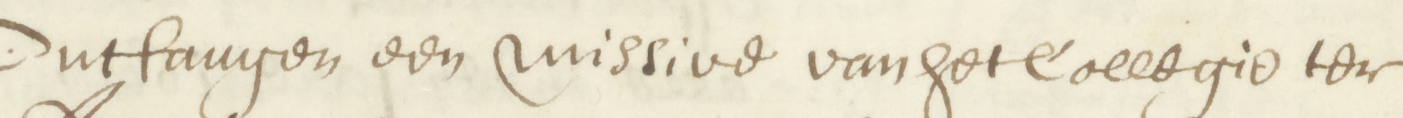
Ontfangen een missive van het Collegie ter
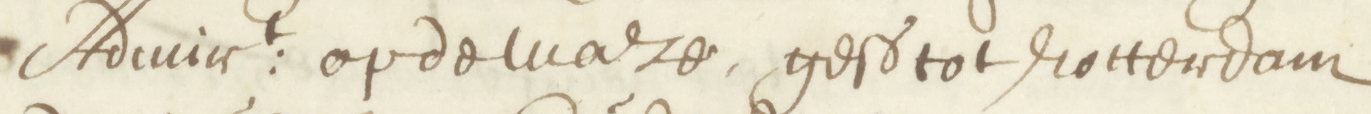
Admirt: opde maze, gess tot rotterdam
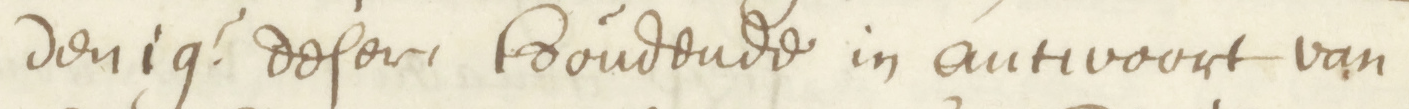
den 19e. deser, houdende in antwoort van —
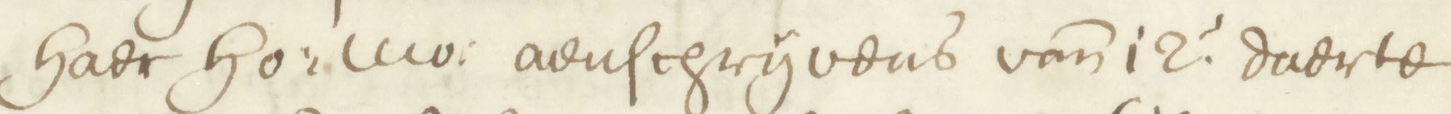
haer ho:mo: aenschrijvens van 12e. daerte
